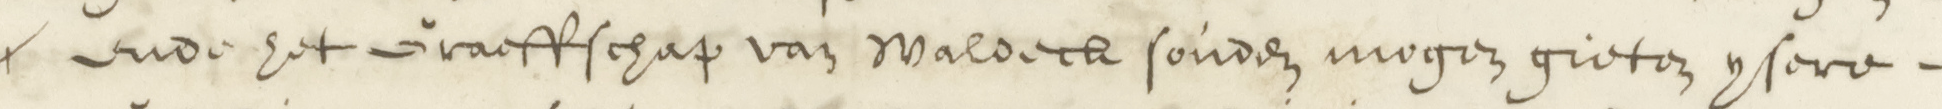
ende het Graeffschap van Waldeck souden mogen gieten ysere
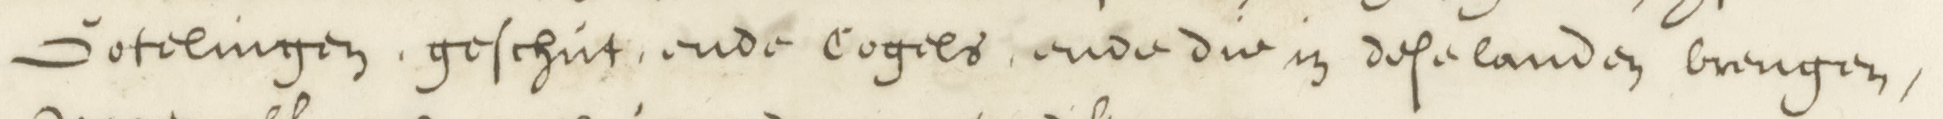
Gotelingen, geschut, ende Cogels, ende die in dese landen brengen,
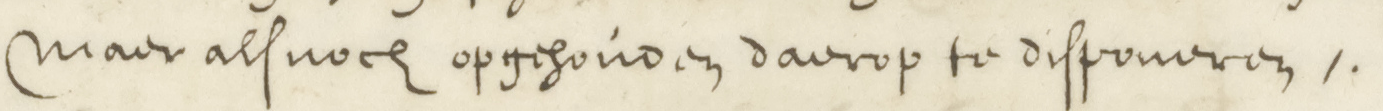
maer alsnoch opgehouden daerop te disponeren.
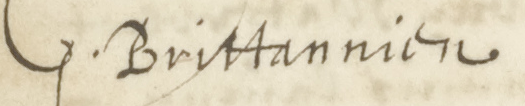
G. Brittannien
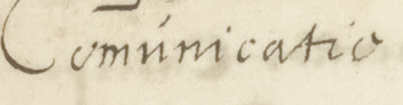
Comunicatie
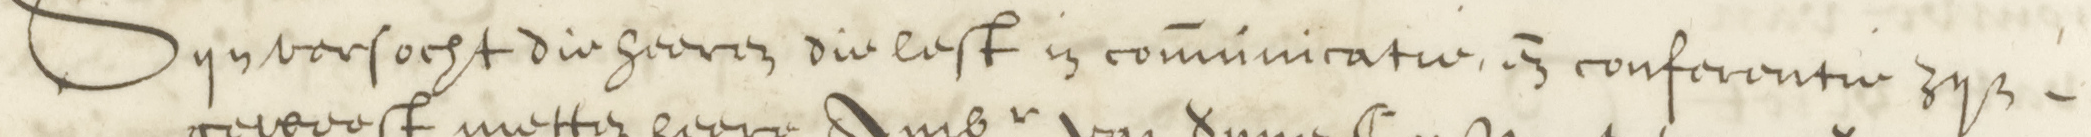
Syn versocht die heeren die lest in comunicatie, en conferentie zijn -
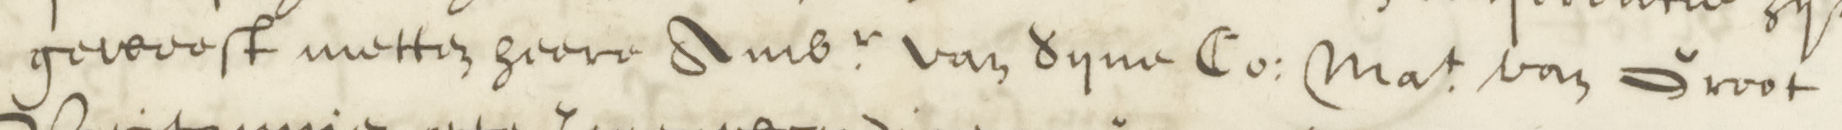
geweest metten heere Ambr. van Syne Co: Mat. van Groot —
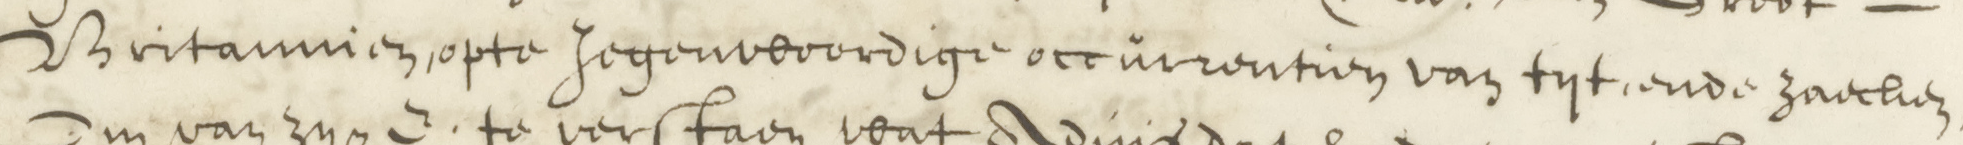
Britannien, opte Jegenwoordige occurrentien van tyt, ende zaecken
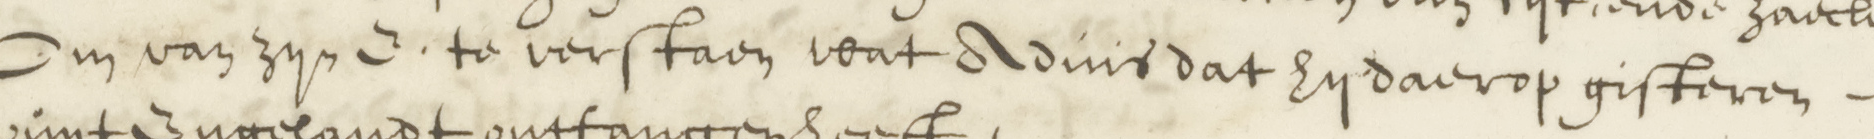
Om van zyn E. te verstaen wat Aduis dat hy daerop gisteren -
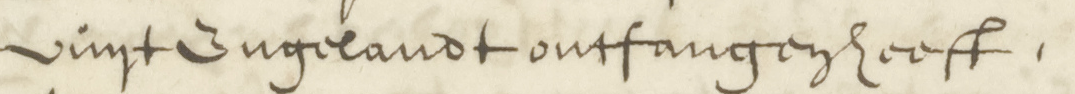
vuyt Engelandt ontfangen heeft.
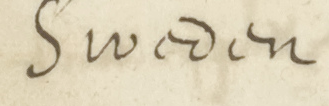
Sweden
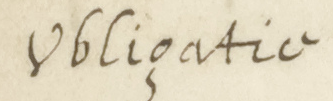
Obligatie
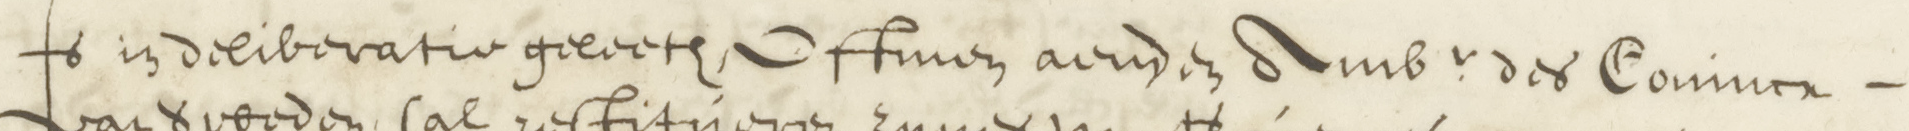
Is in deliberatie geleeth Offmen aenden Ambr. des Conincx -
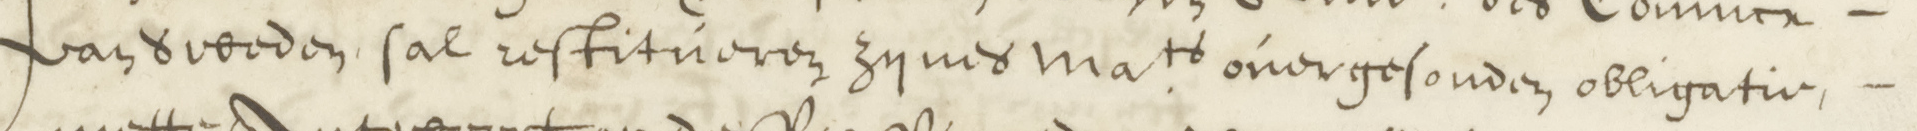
van Sweden sal restitueren zynes mats. ouergesonden obligatie, -
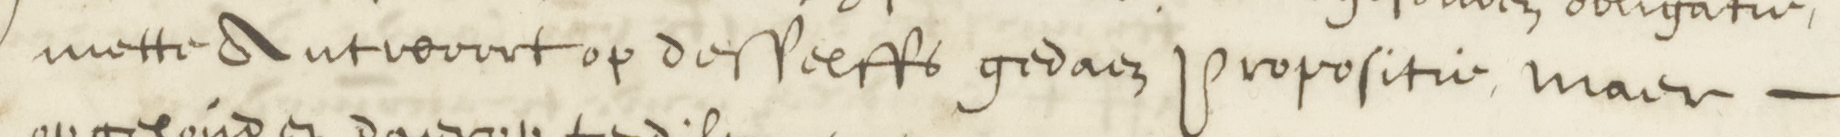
mette Antwoort op desselffs gedaen Propositie, maer —
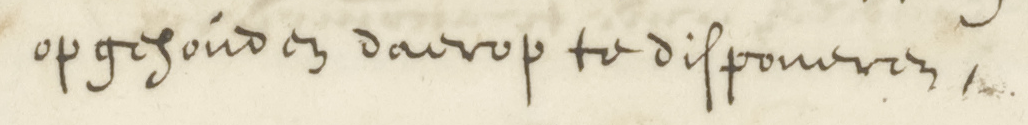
opgehouden daerop te disponeren.
